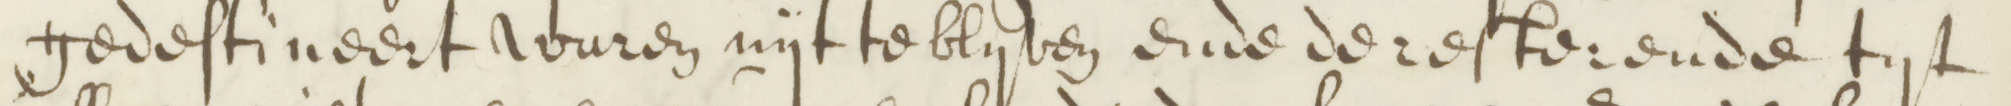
gedestineert waren uijt te blyven ende de resterende tyt
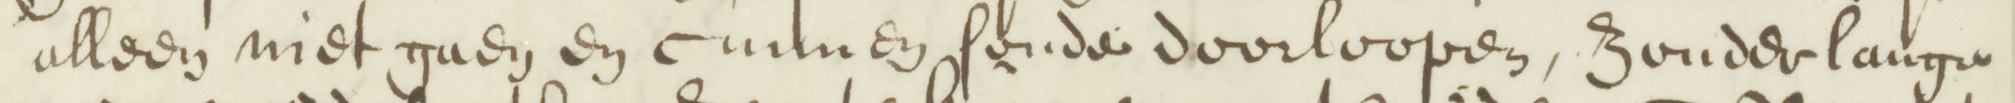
alleen niet gaen en cunnen soude doorloopen, zonder lange
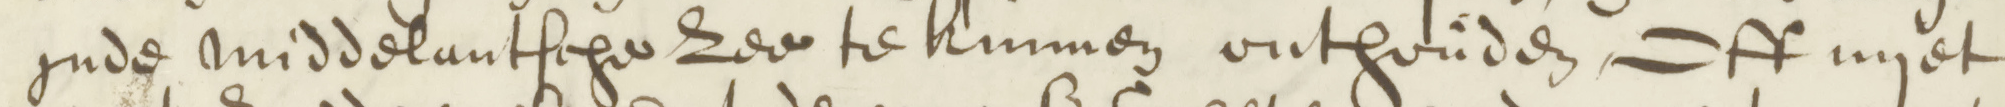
inde middelantsche Zee te kunnen onthouden, Off nyet
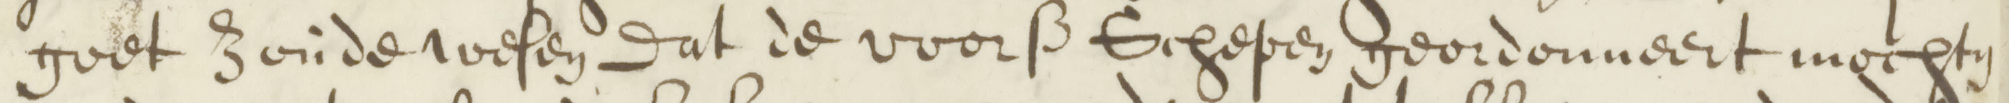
goet zoude wesen dat de voors Schepen geordonneert mochten
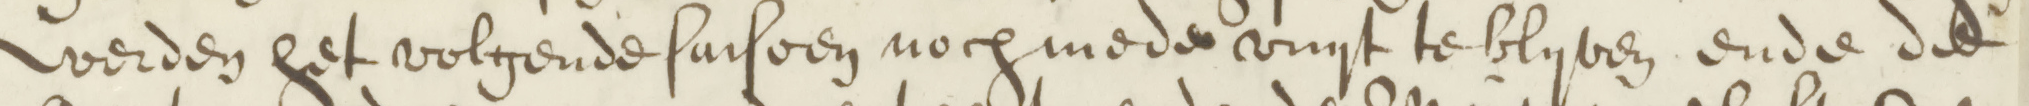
werden het volgende saisoen noch mede vuyt te blyven ende de
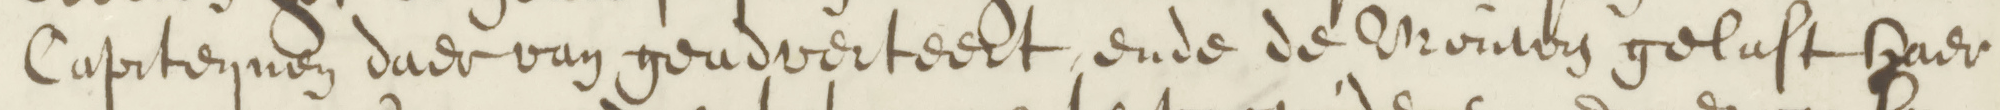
Capiteynen daer van geadverteert, ende de Vrouwen gelast haer
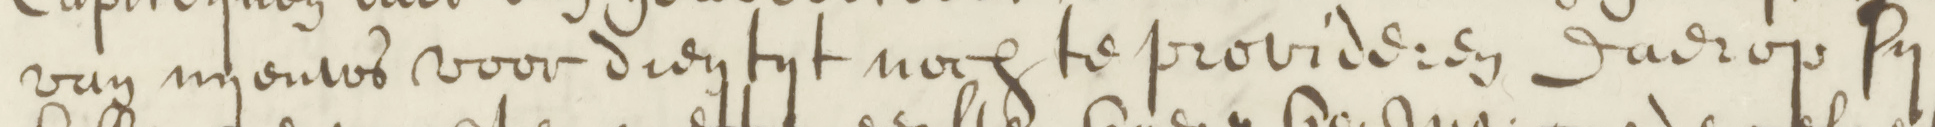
van nyeuws voor dien tyt noch te provideren Daerop sy
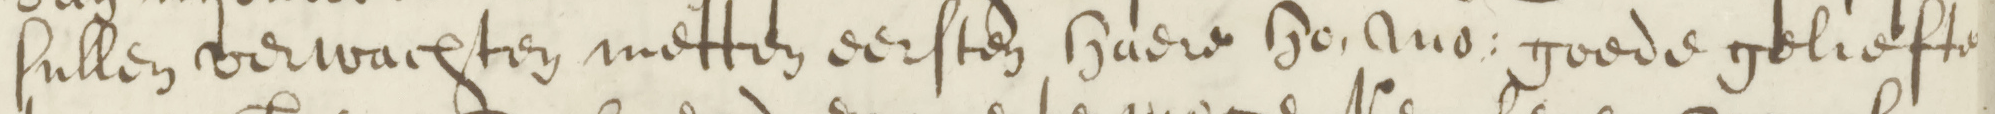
sullen verwachten metten eersten Haere Ho:Mo: goede geliefte
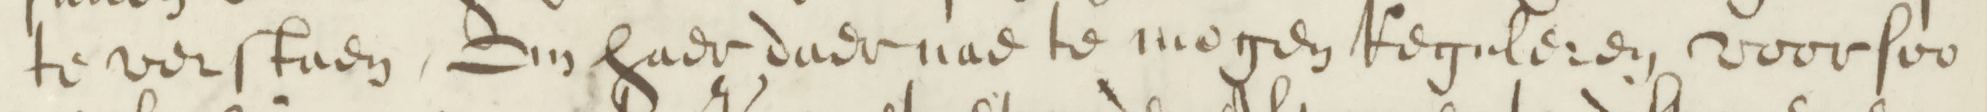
te verstaen, Om haer daer nae te mogen Reguleren voor soo
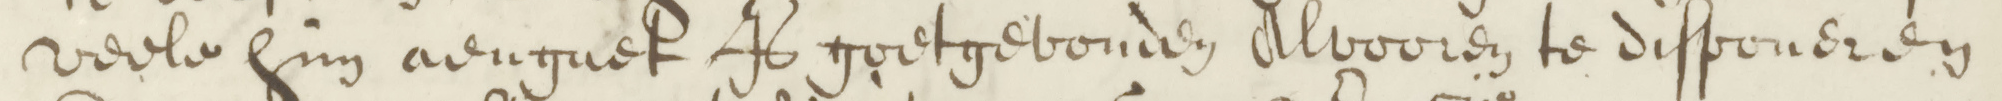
veele hun aengaet Is goetgevonden Alvooren te disponeren
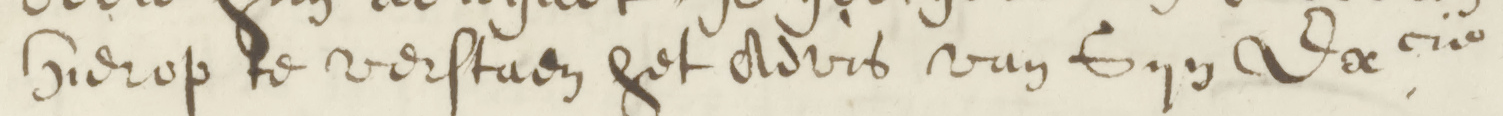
hierop te verstaen het Advis van Syn Excie.
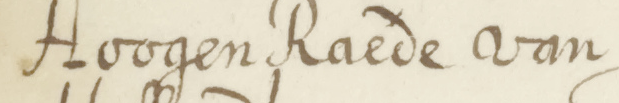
Hoogen Raede van
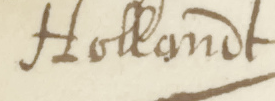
Hollandt
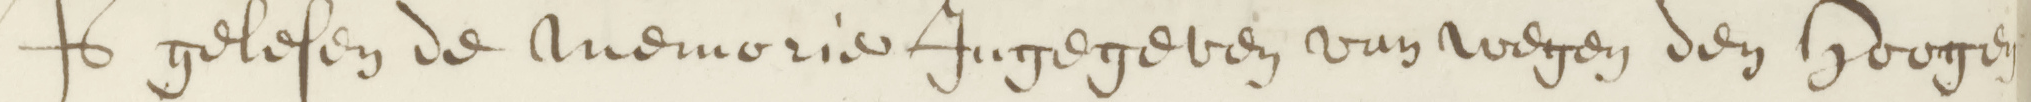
Is gelesen de memorie Ingegeven van wegen den Hoogen
